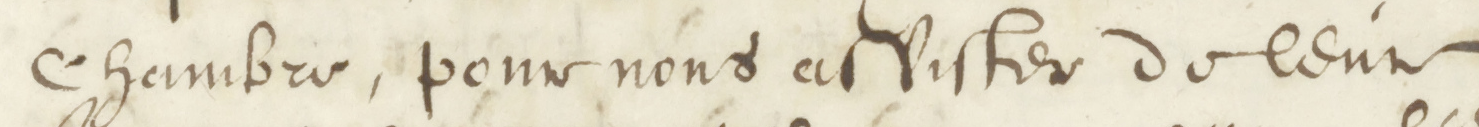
Chambre, pour nous assister de leur
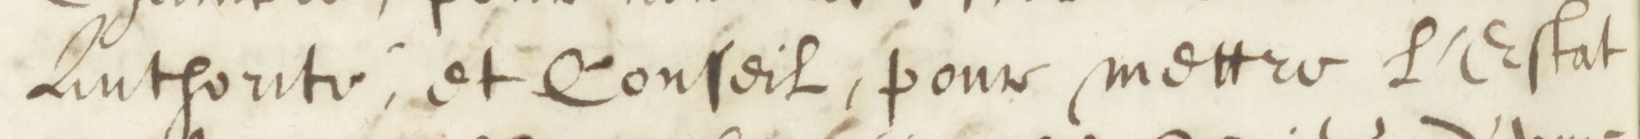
Authorité, et Conseil, pour mettre l‛Estat
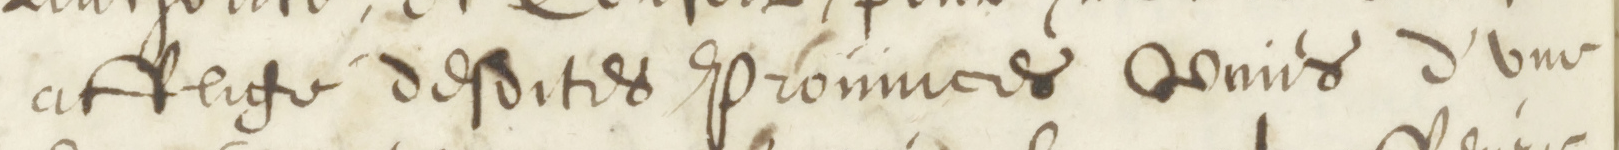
affligé desdites Prouinces viues d'une
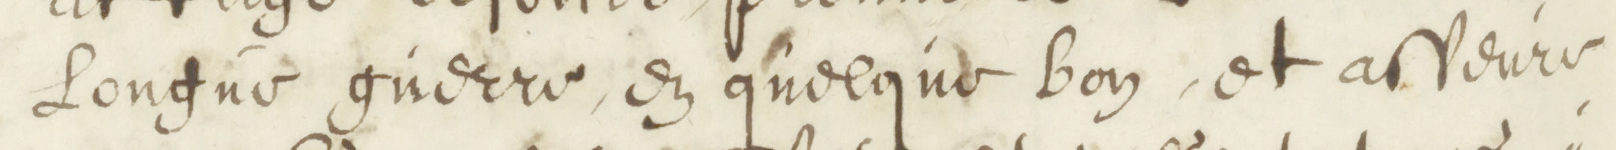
Longue guerre en quelque bon et asseure
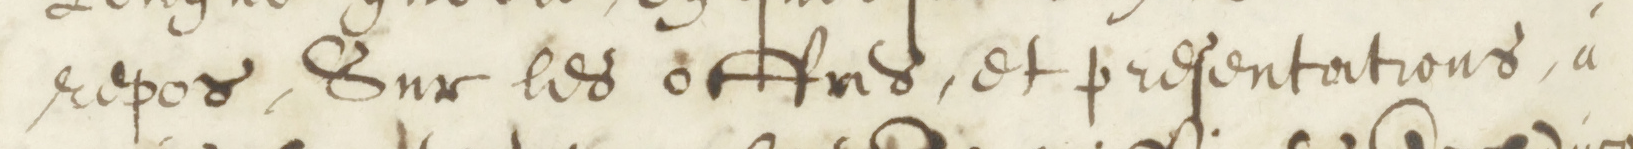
repos, Sur les offres, et presentations, á
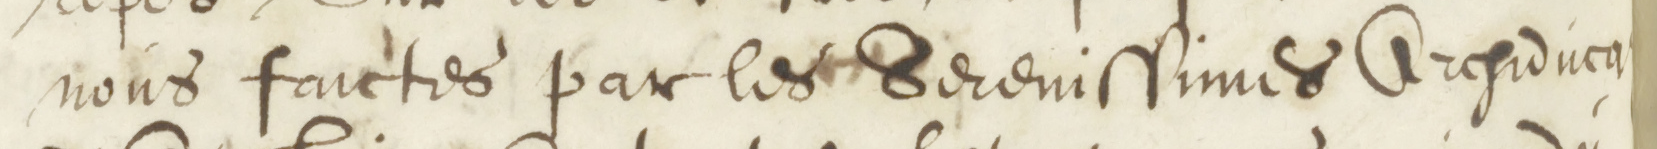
nous faictes par les Serenissimes Archiducq
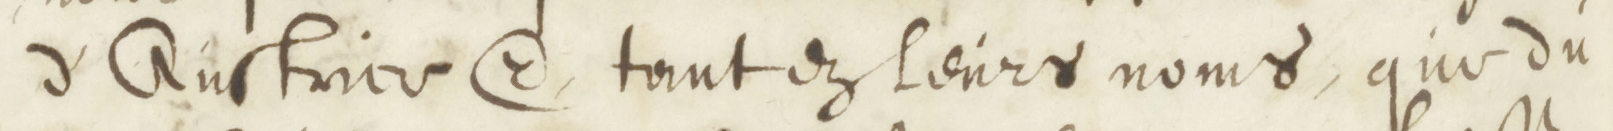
d'Austrice @, tant en leurs noms, que du
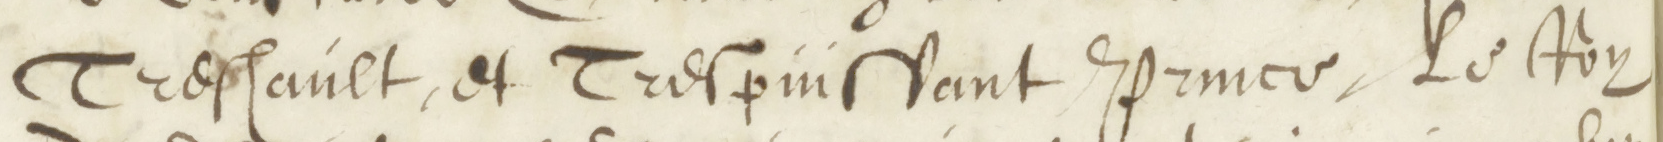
Treshault, et Trespuissant Prince, Le Roy,
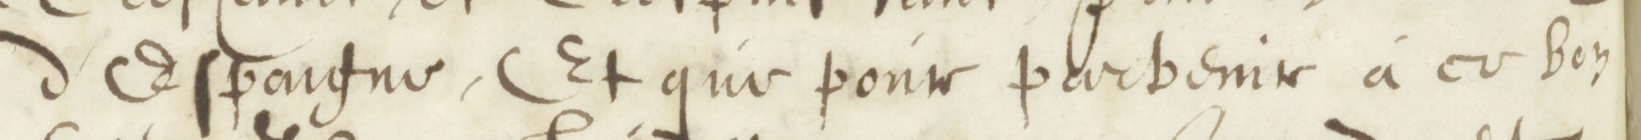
d'Espaigne. Et que pour parvenir a ce bon
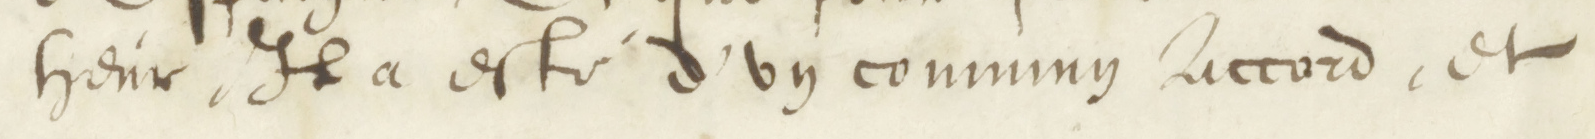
heur, Il a esté d'vn commun accord, et
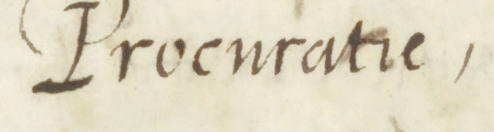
Procuratie.
